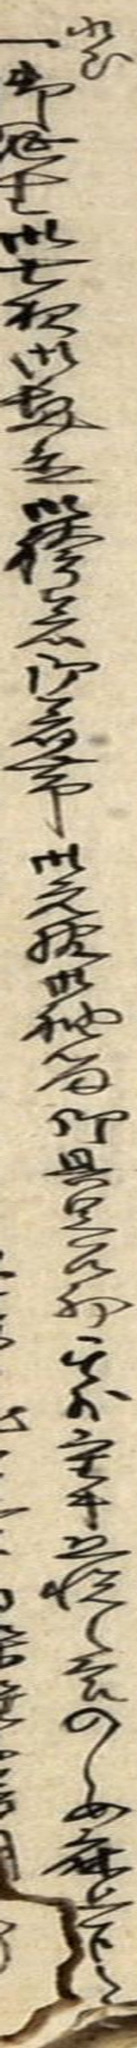一御誕生御七夜御髪置御袴着御着帯御元服御袖留御具足召初其外重き恐悦之節のしめ麻上下之
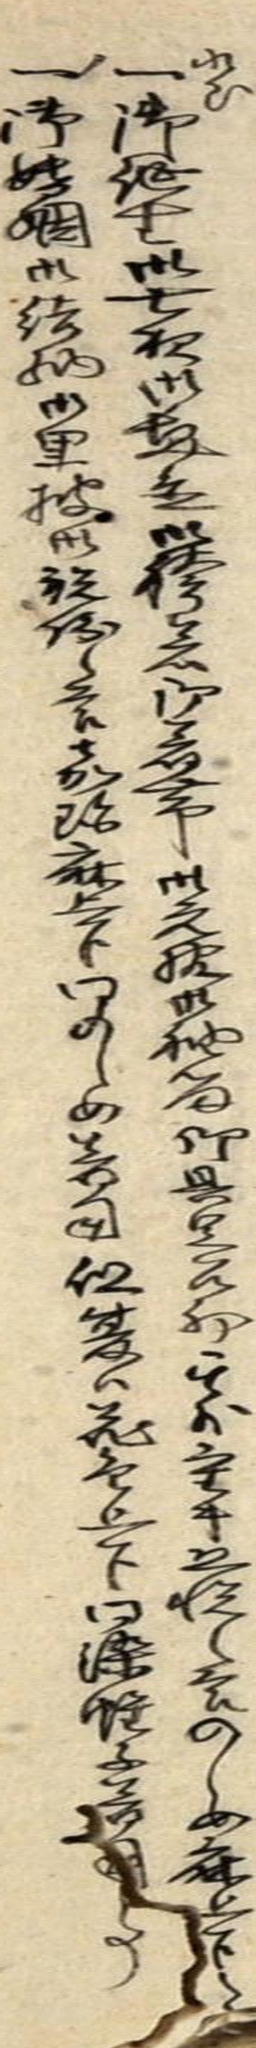一御婚姻御結納御里披御祝儀之節嘉珍麻上下同のしめ着用但夏は花色上下同染帷子着用之事

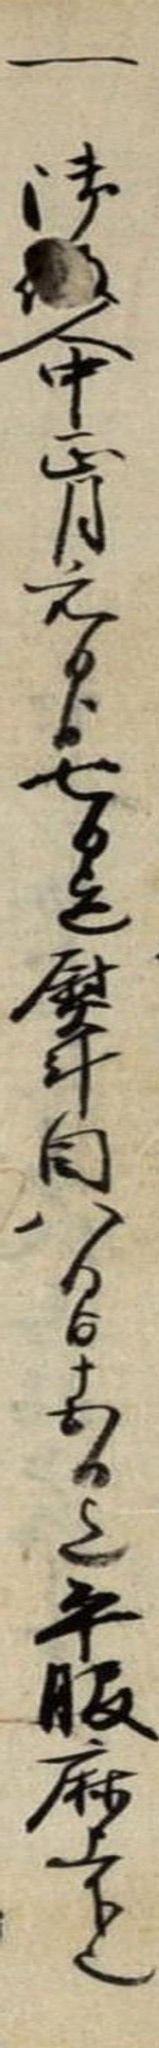一御役人中正月元日ゟ七日迄熨斗目八日ゟ十五日迄平服麻上下也
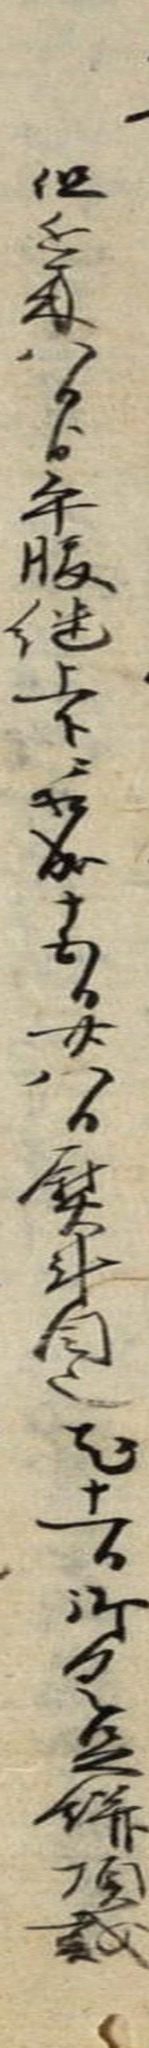但近来八日ゟ平服継上下に相成十五日廿八日熨斗目也尤十一日御具足餅頂戴
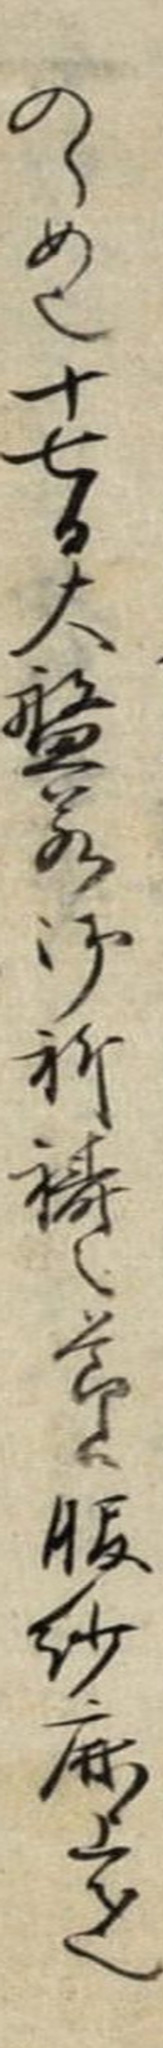のしめ也十七日大盤若御祈祷之節は服紗麻上下也
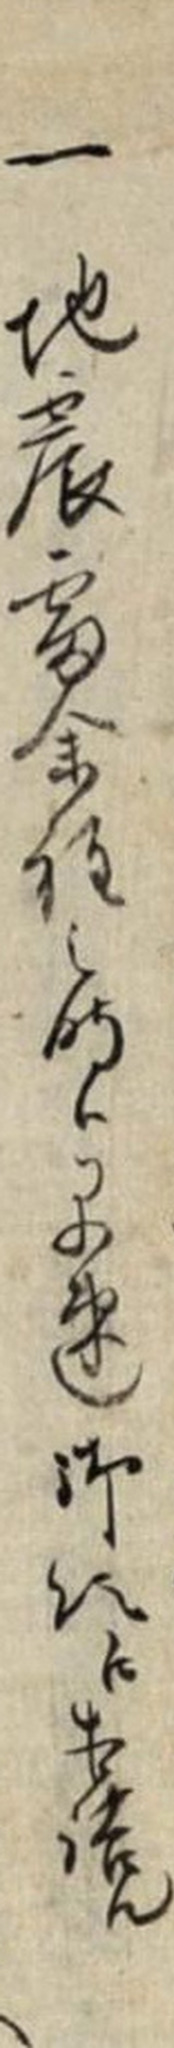一地震雷余程之時は早速御次江相詰る
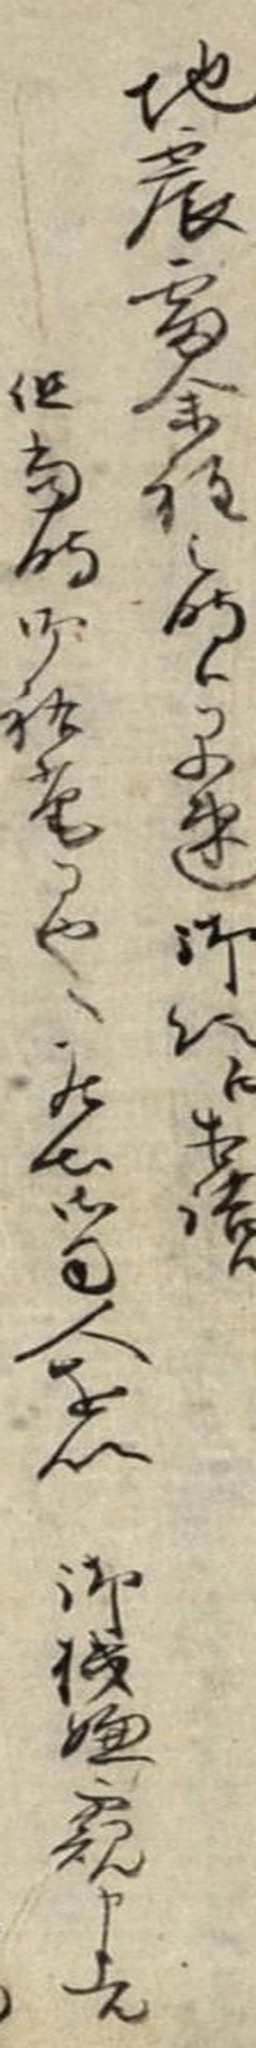但当時御祐筆部やへ罷出御用人を以御機嫌窺申上る
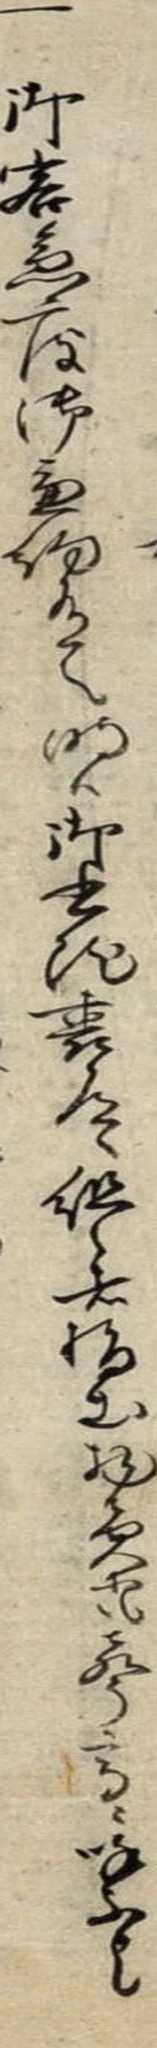一御客急度御兼約有之時は御書院裏道へ組之者指出物売等も声高に呼不申候
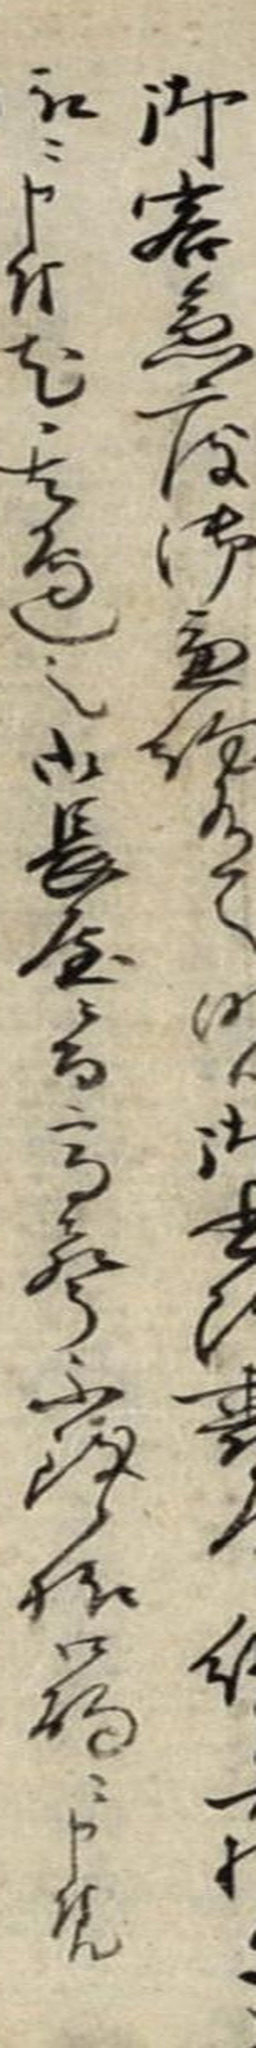様に申付尤其辺之御長屋にて高声不致候様口触に申付る
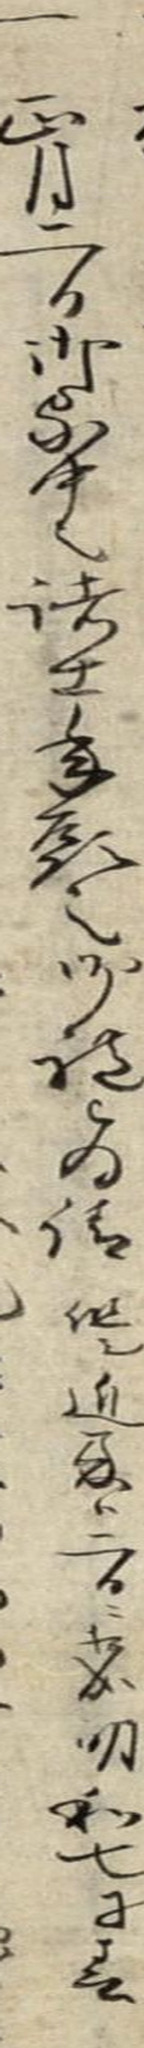一正月二日御家中之諸士年頭之御礼被為請但し近来は二日に相成明和七刁春
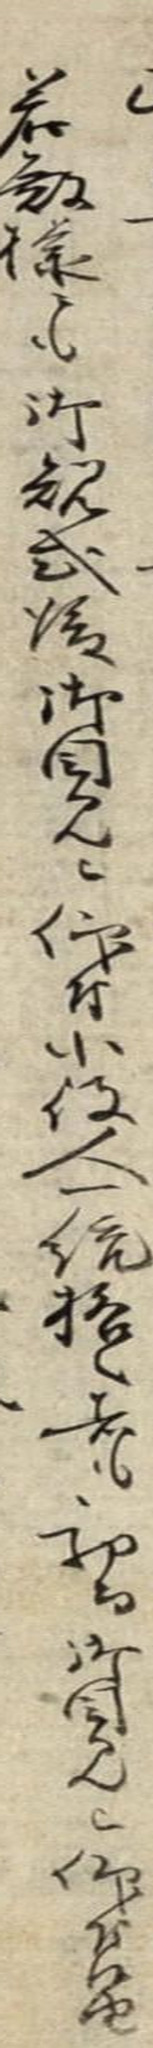若殿様にも御規式後御目見被仰付小役人一統格之者も初て御目見被仰付候由
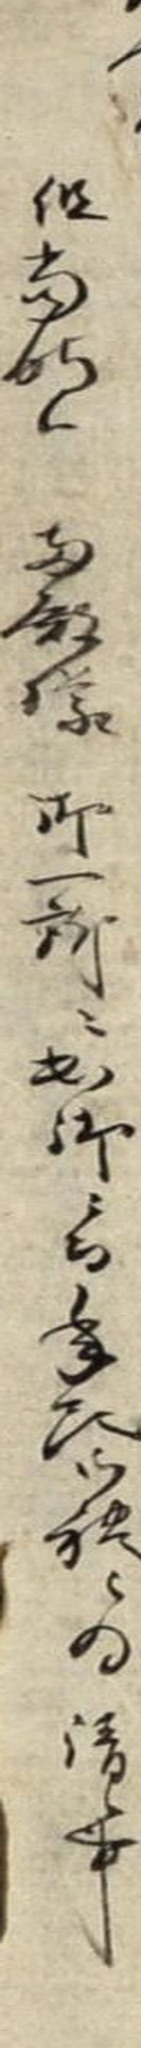但当時は両殿様御一所に出御にて年頭御礼被為請候事
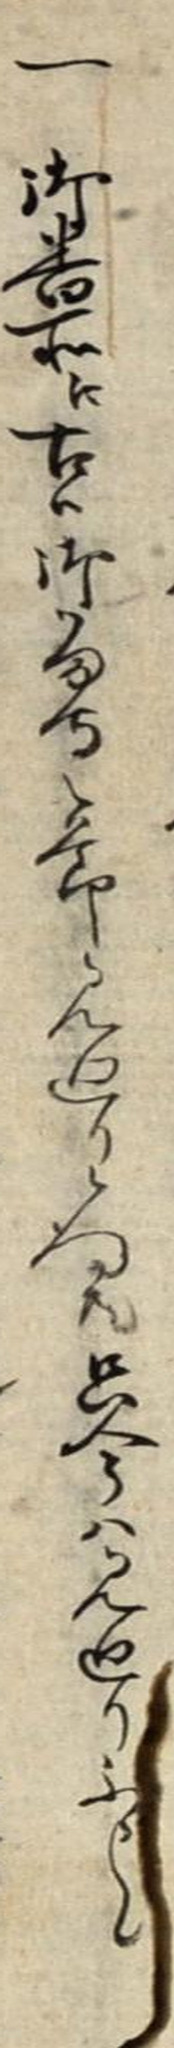一御番所江古は御留守之節見廻り候得共只今は見廻り不申候
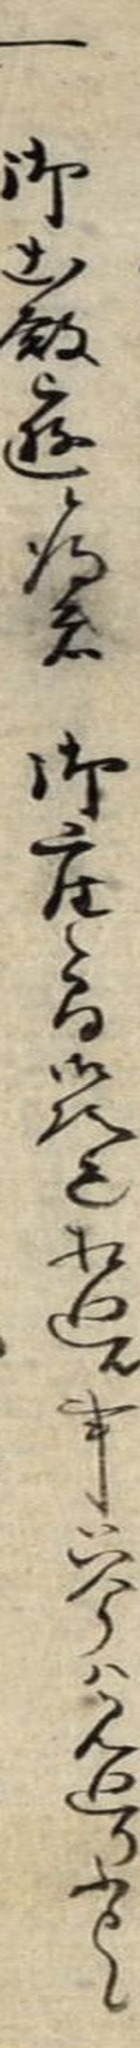一御出殿被遊候得は御座之間御次迄相廻る事只今は見廻り不申候
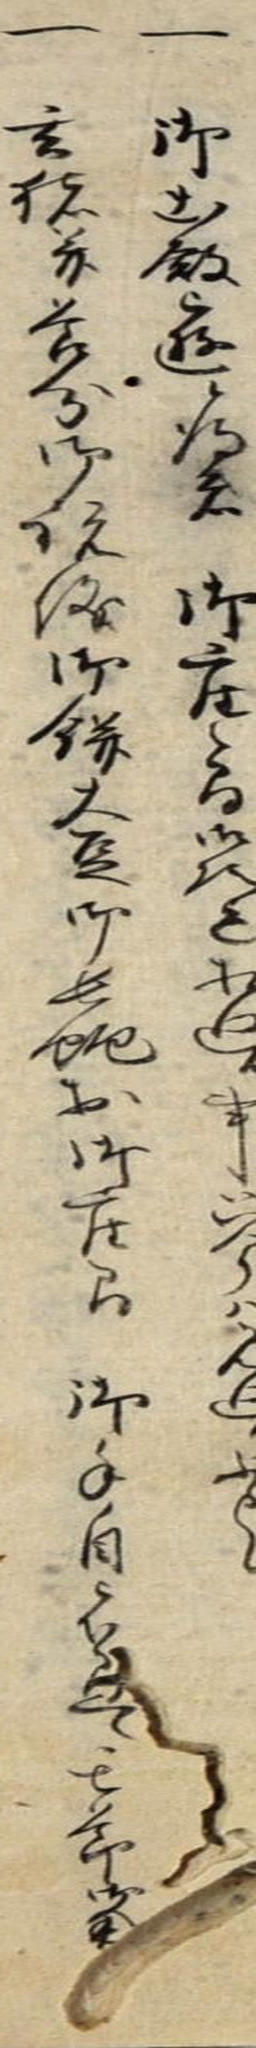一玄猪并節分御祝儀御餅大豆御長蚫於御座間御手自被下置候其節御用

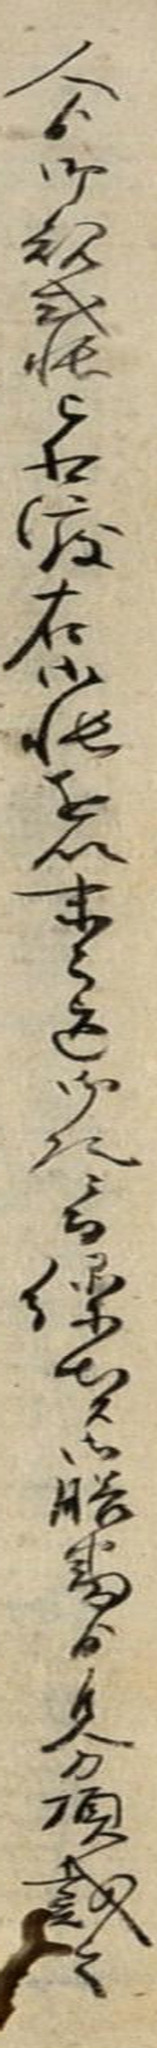人ゟ御規式帳被相渡右御帳を以末々迄御次にて繰出す御膳番ゟ自分頂戴之
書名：三都并道中之部
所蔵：福井県文書館 Fukui Prefectural Archives
